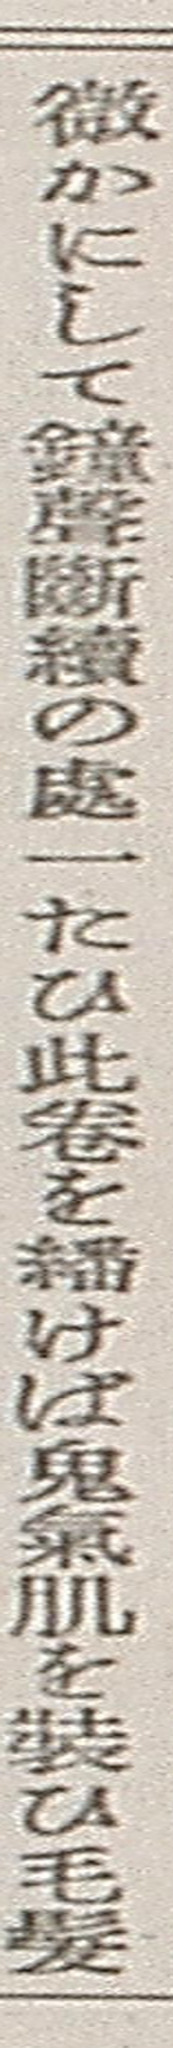微かにして鐘声断続の処一たひ此巻を繙けば鬼気肌を装ひ毛髪
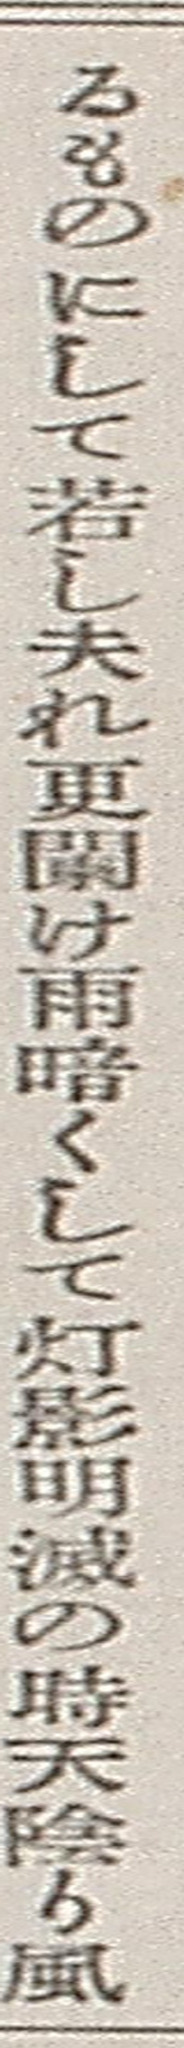るものにして若し夫れ更闌け雨暗くして灯影明滅の時天陰り風
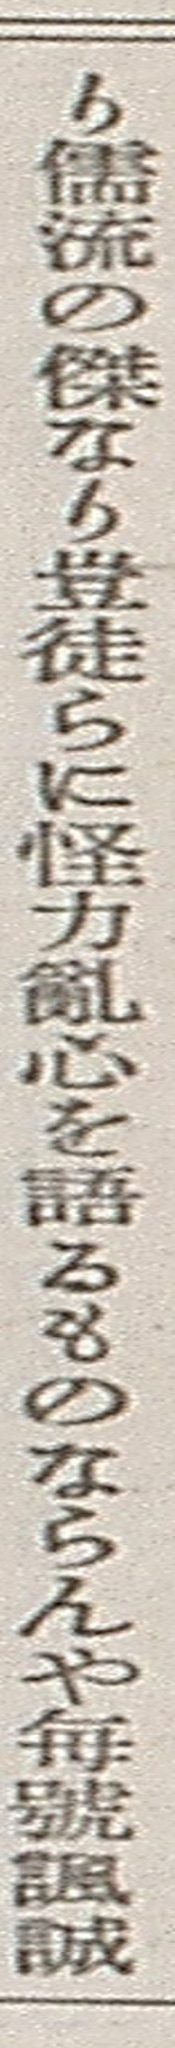り儒流の傑なり豈徒らに怪力乱心を語るものならんや毎号諷誠
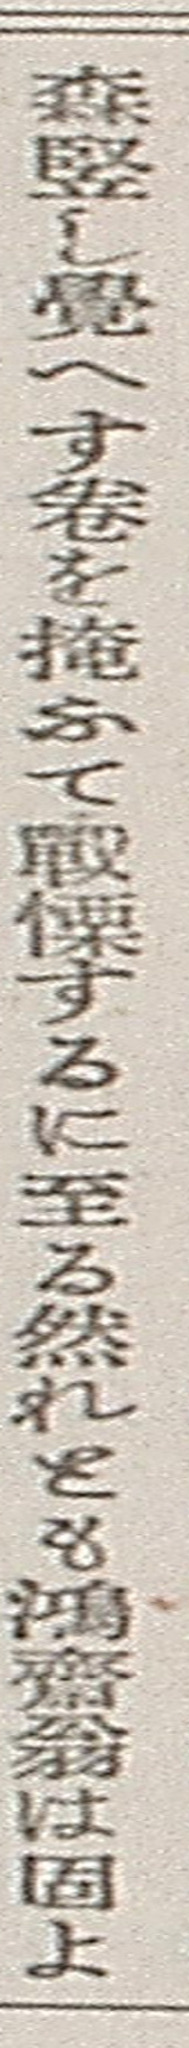森堅し覚へす巻を掩ふて戦慄するに至る然れとも鴻斉翁は固よ
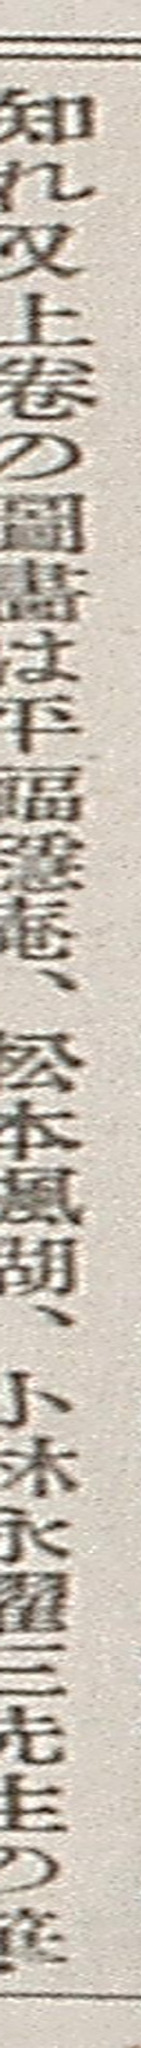知れ又上巻の図画は平福穏庵、松本楓湖、小林永濯三先生の筆
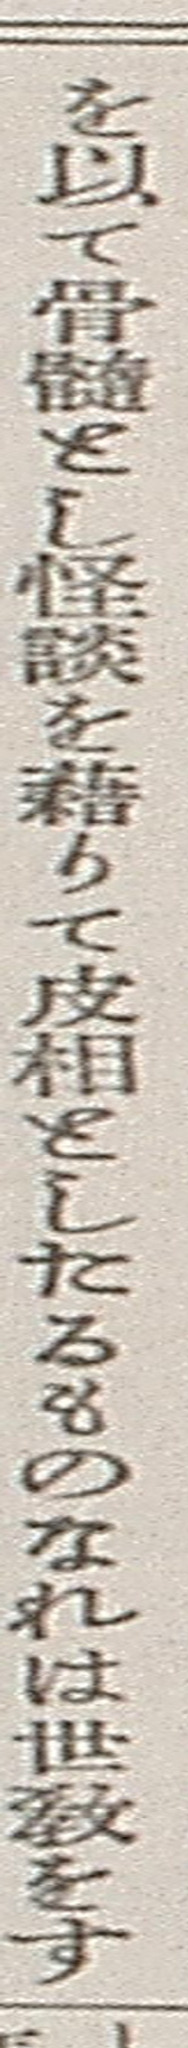を以て骨体とし怪談を藉りて皮相としたるものなれは世教をす
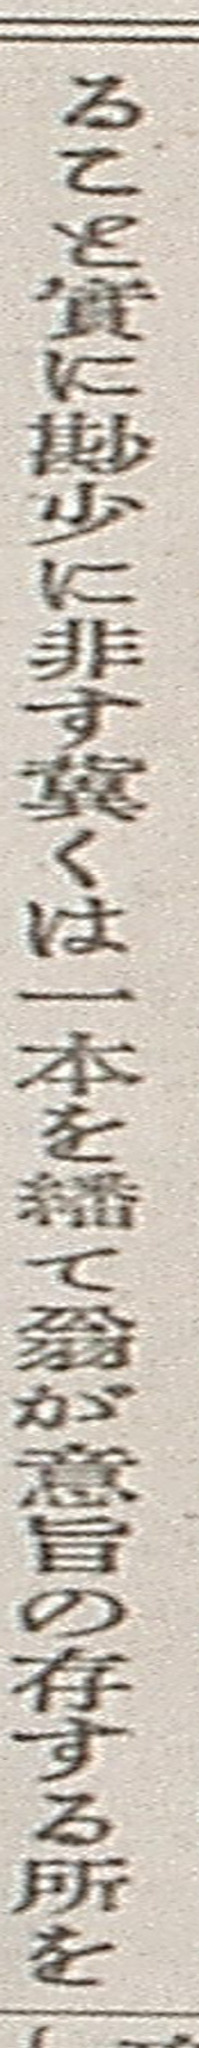ること実に尠少に非す冀くは一本を繙て翁が意旨を存する所を
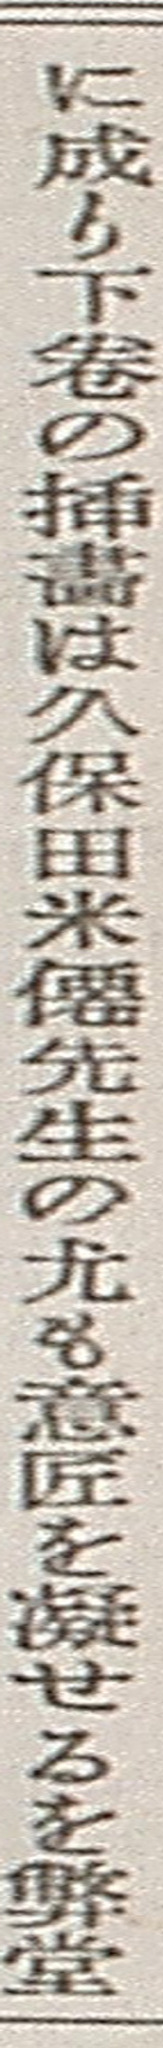に成り下巻の挿画は久保田米僊先生の尤も意匠を凝せるを弊堂
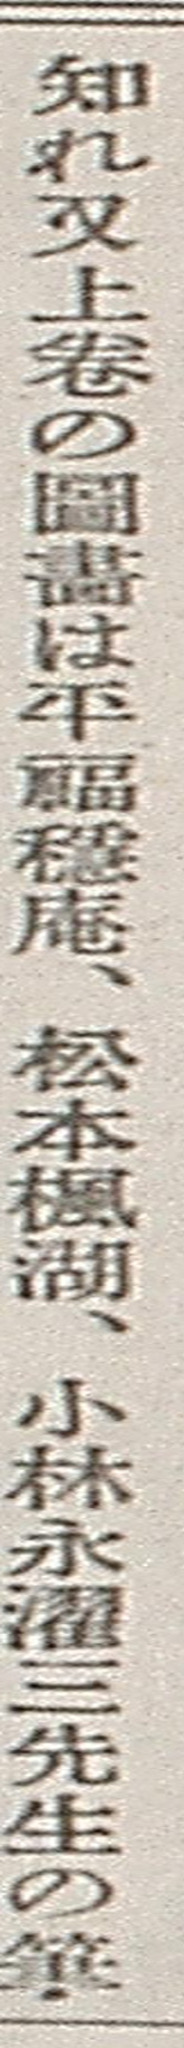知れ又上巻の図画は平福穏庵、松本楓湖、小林永濯三先生の筆
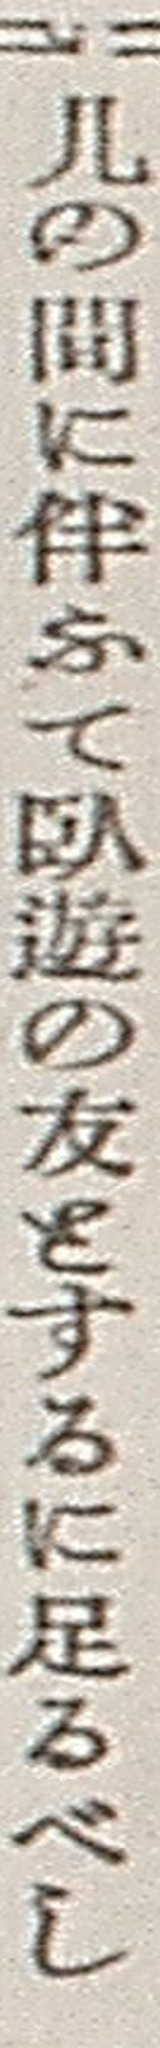几の間に伴ふて臥遊の友とするに足るべし
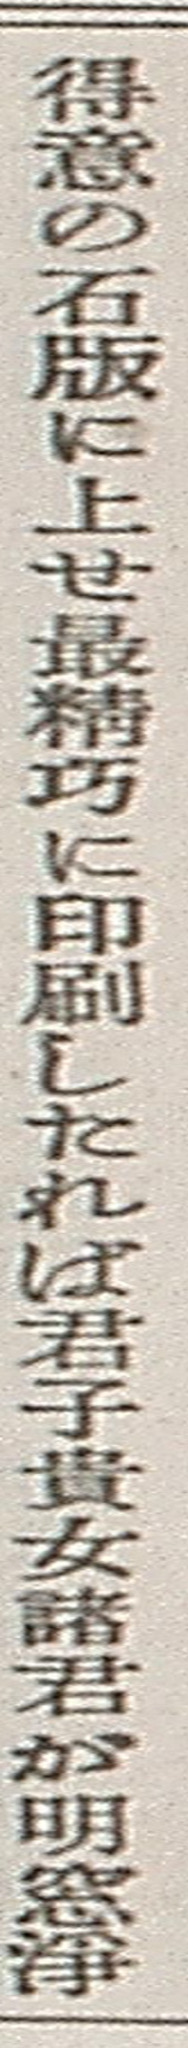得意の石版に上せ最精巧に印刷したれば君子貴女諸君が明窓淨
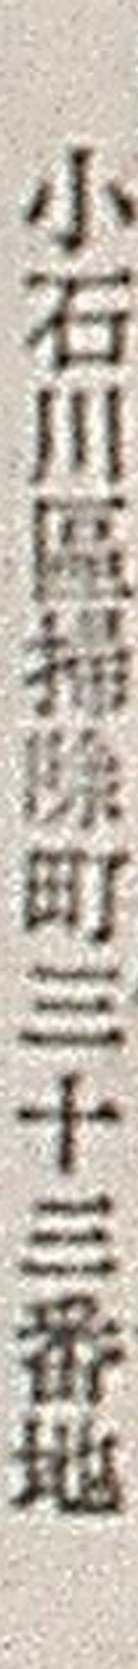小石川区掃除町三十三番地

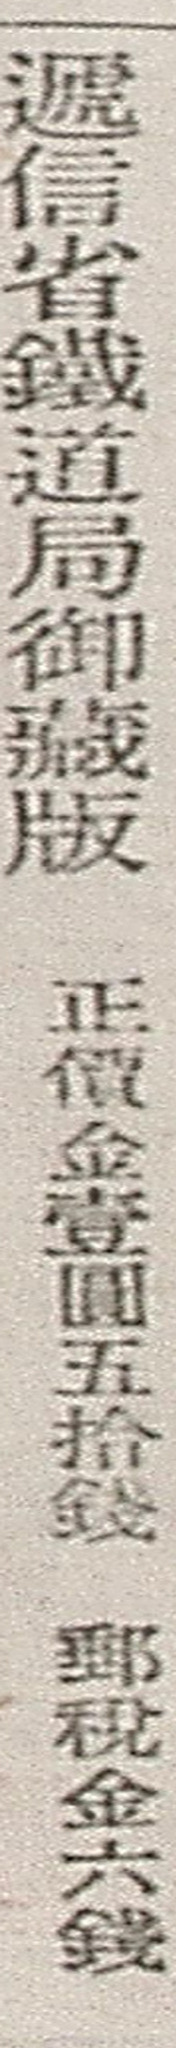逓信省鉄道局御蔵版正価金壱円五拾銭郵税金六銭
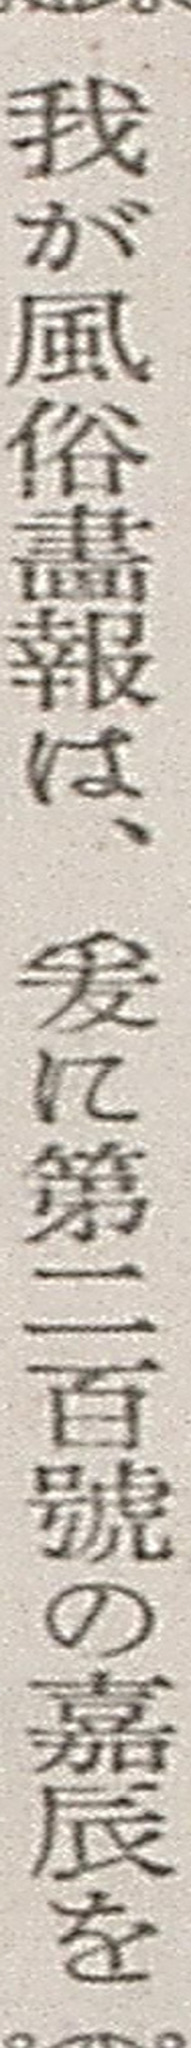我が風俗画報は、爰に第二百号の嘉辰を
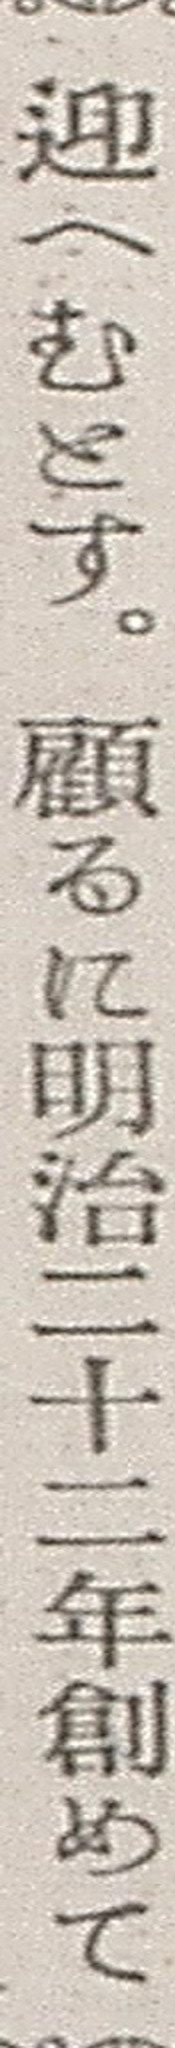迎へむとす。顧るに明治二十二年創めて
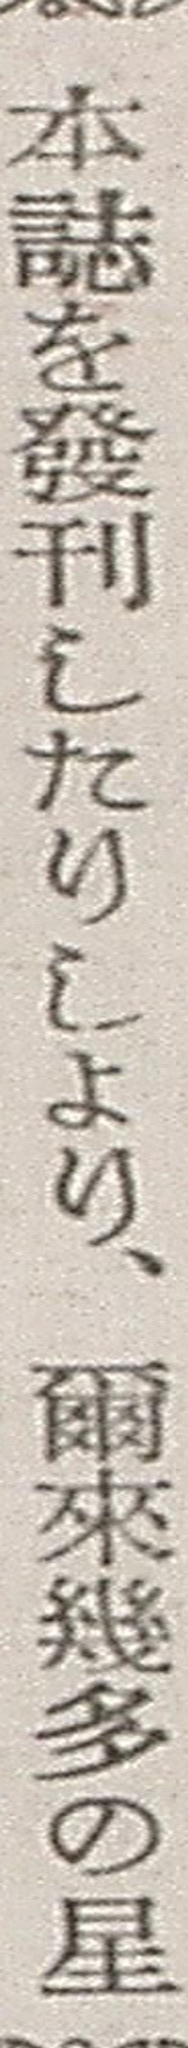本誌を発刊したりしより、爾来幾多の星
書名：風俗畫報臨時増刊第百九十九號　明治三十二年十月各地災害圖會（前編之續）
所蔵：東京大学地震研究所図書室 Earthquake Research Institute Library, The University of Tokyo, JAPAN
